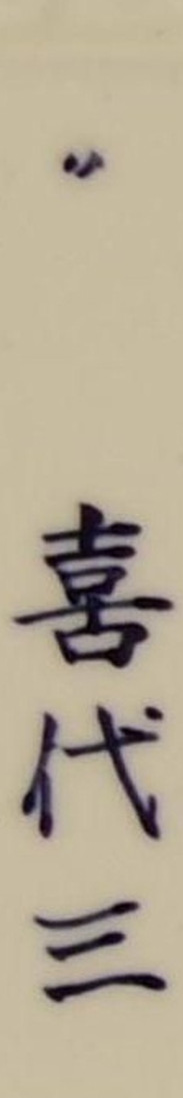喜代三
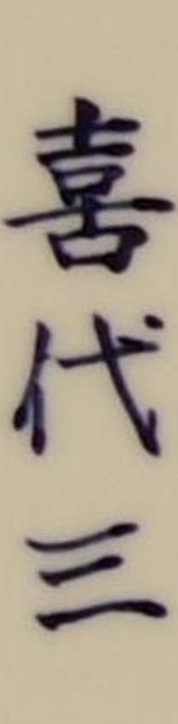喜代三
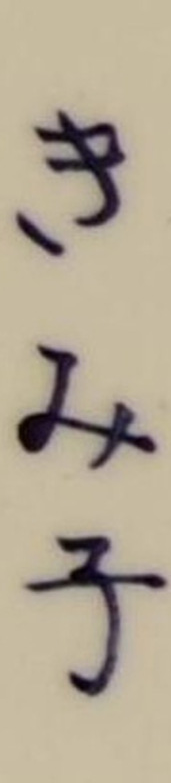きみ子
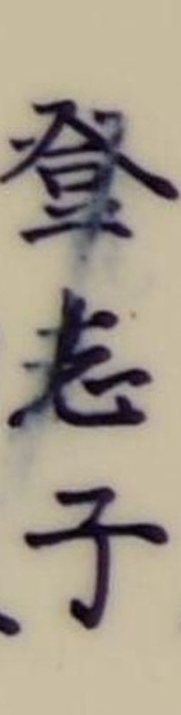登志子

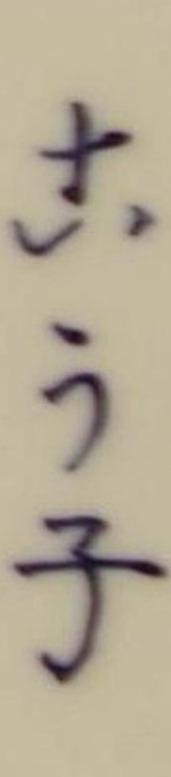こう子
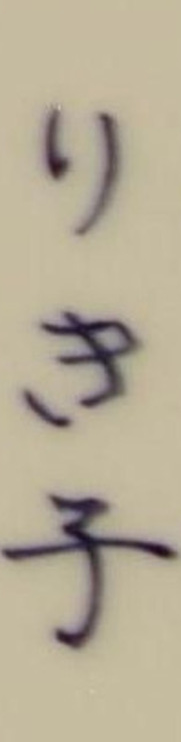りき子
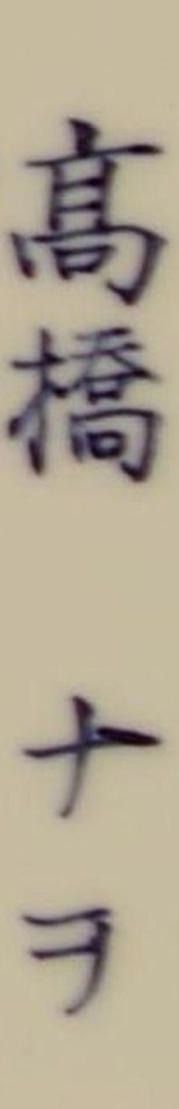高橋ナヲ
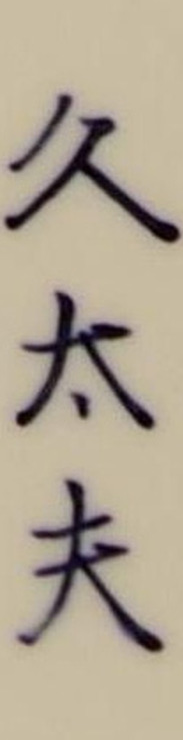久太夫
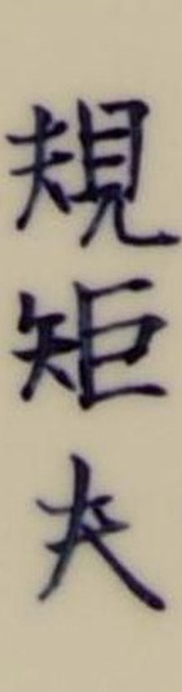規矩夫
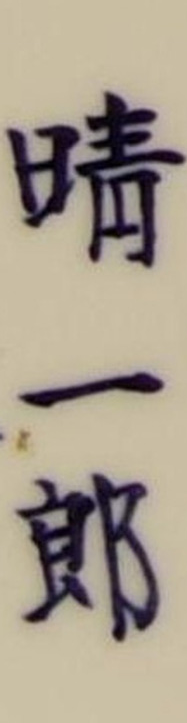晴一郎
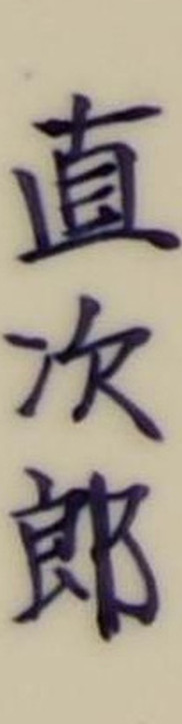直次郎

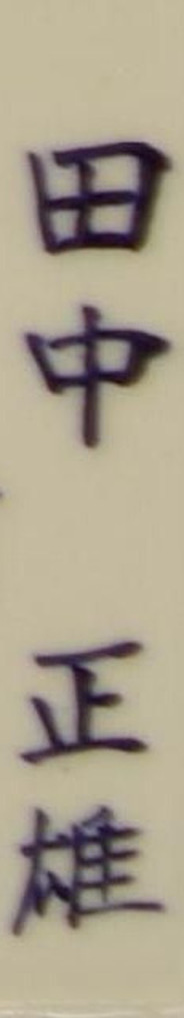田中正雄
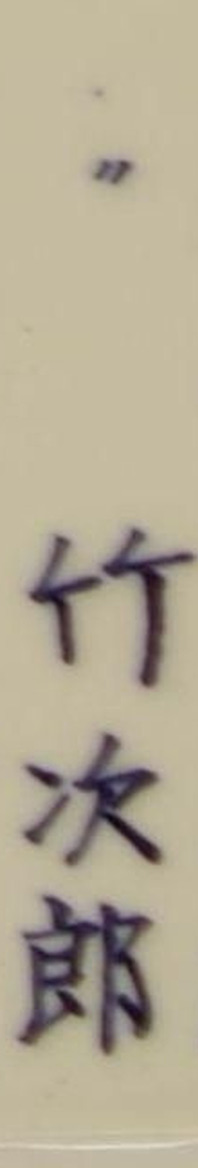竹次郎
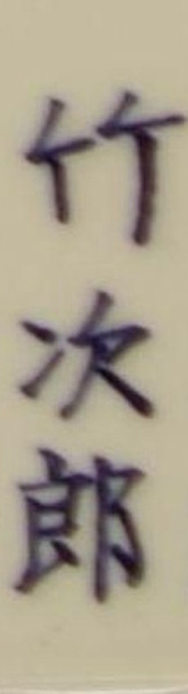竹次郎
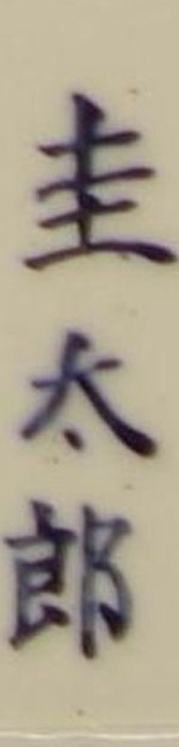圭太郎
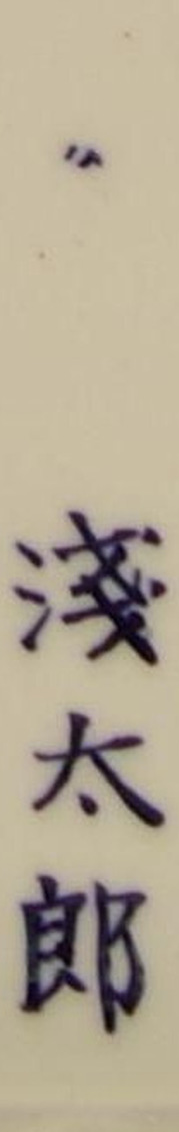浅太郎
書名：A~D
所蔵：koyasan kongobuji
